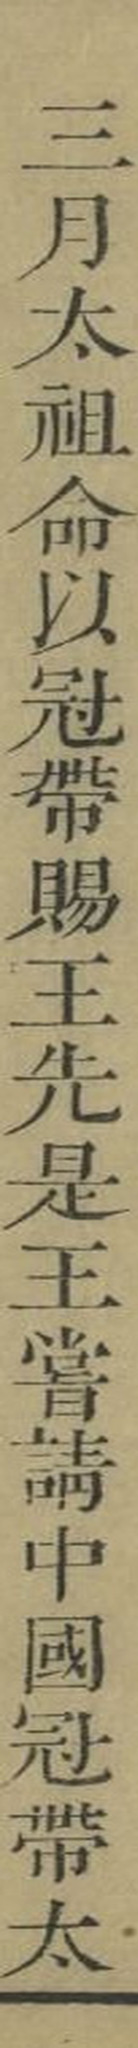三月太祖命以冠帯賜王先是王嘗請中国冠帯太
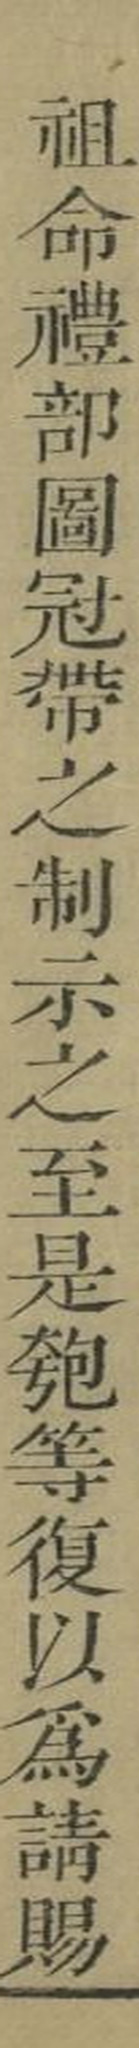祖命礼部図冠帯之制示之至是匏等復以為請賜
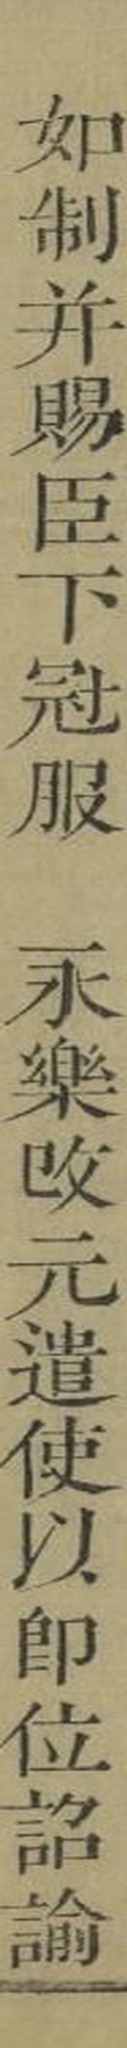如制并賜臣下冠服永楽改元遣使以即位詔諭
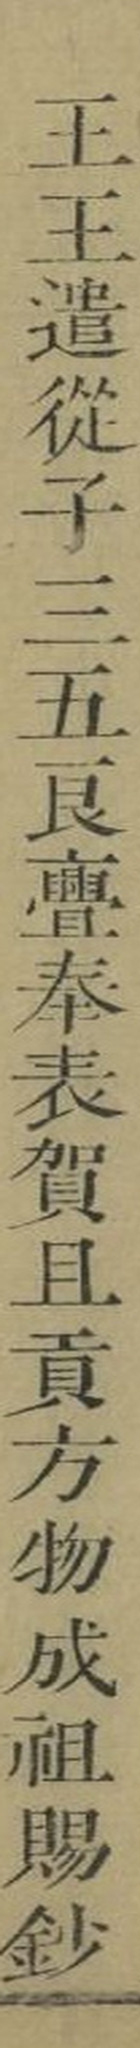王王遣従子三五良亹奉表賀且貢方物成祖賜鈔
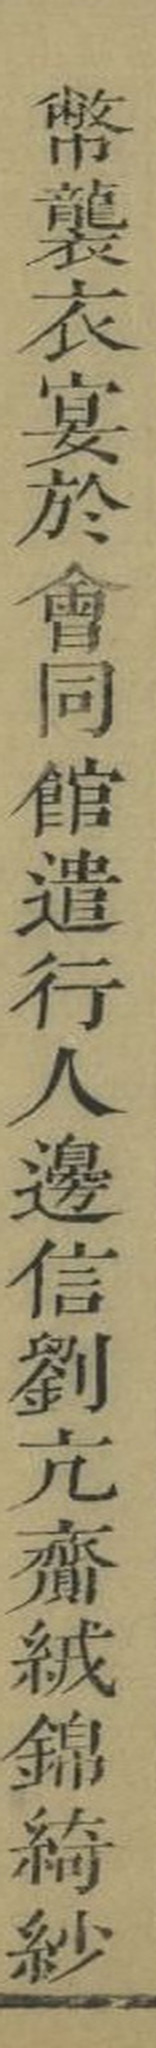幣襲衣宴於会同館遣行人辺信劉亢齎絨錦綺紗
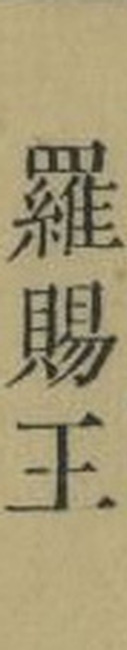羅賜王
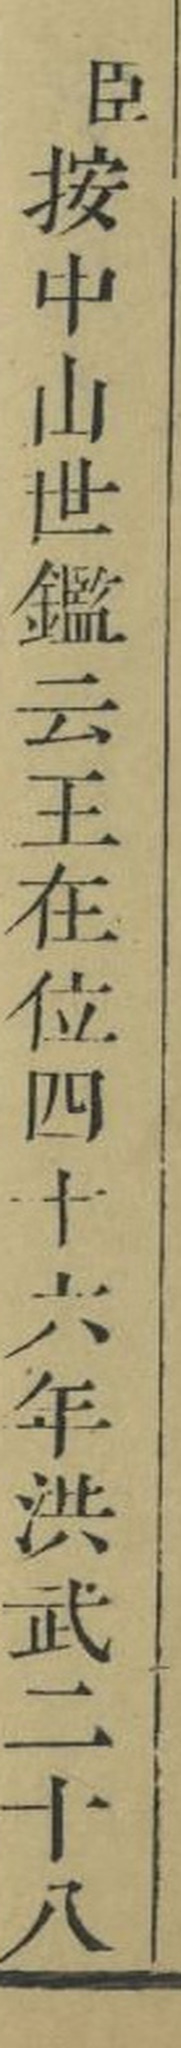臣按中山世鑑云王在位四十六年洪武二十八
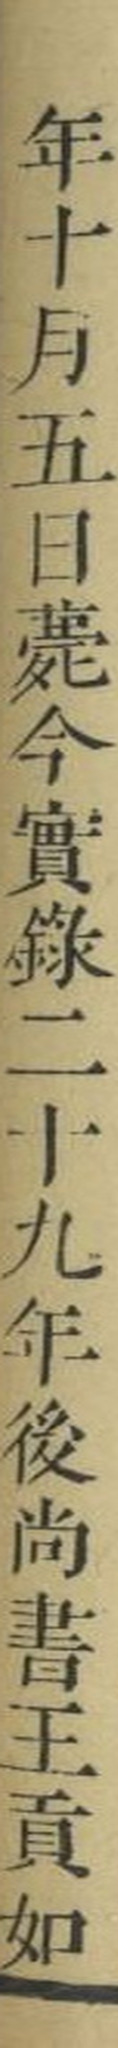年十月五日薨今実録二十九年後尚書王貢如
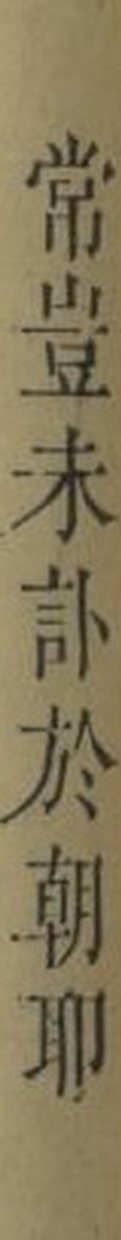常豈未訃於朝耶
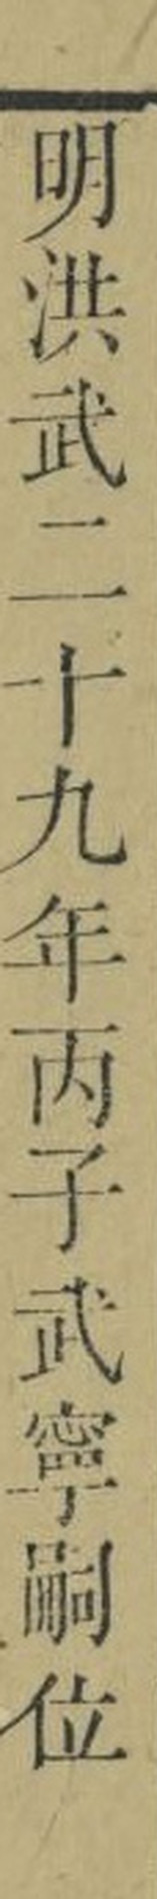明洪武二十九年丙子武寧嗣位
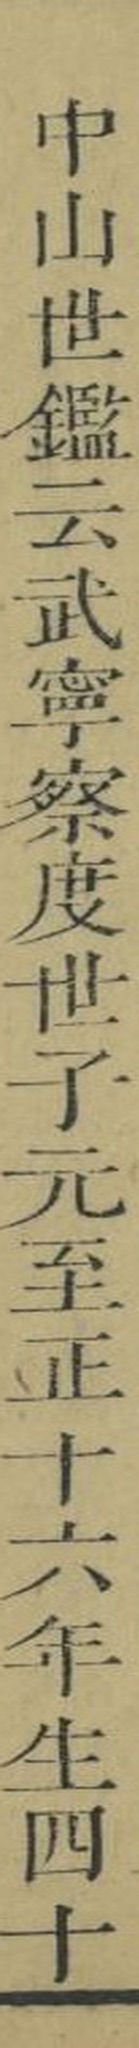中山世鑑云武寧察度世子元至正十六年生四十
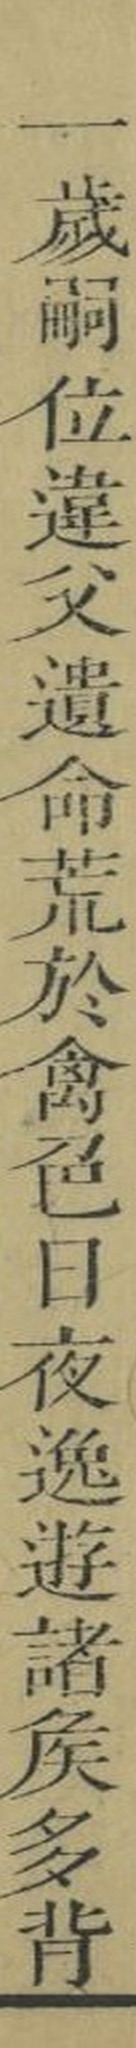一歳嗣位違父遺命荒於禽色日夜逸遊諸侯多背
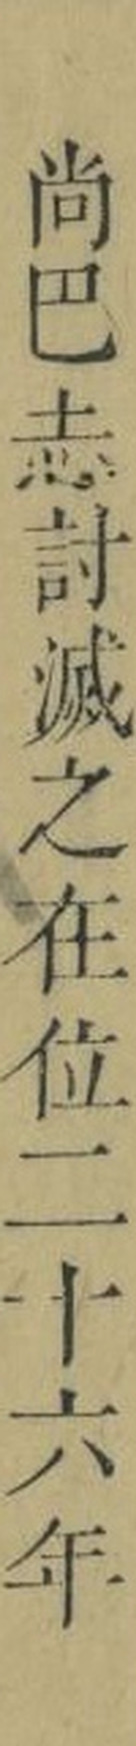尚巴志討滅之在位二十六年
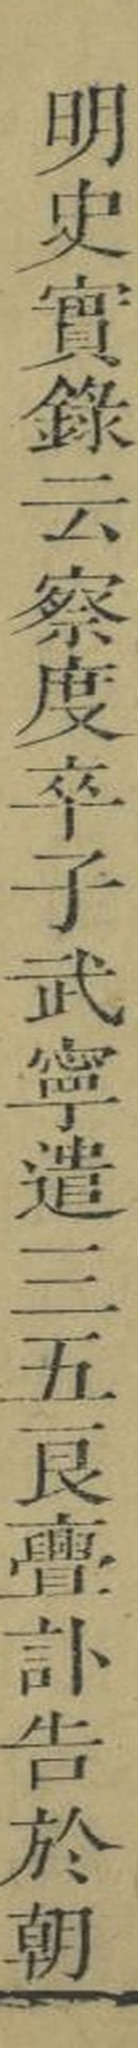明史実録云察度卒子武寧遣三五良亹訃告於朝
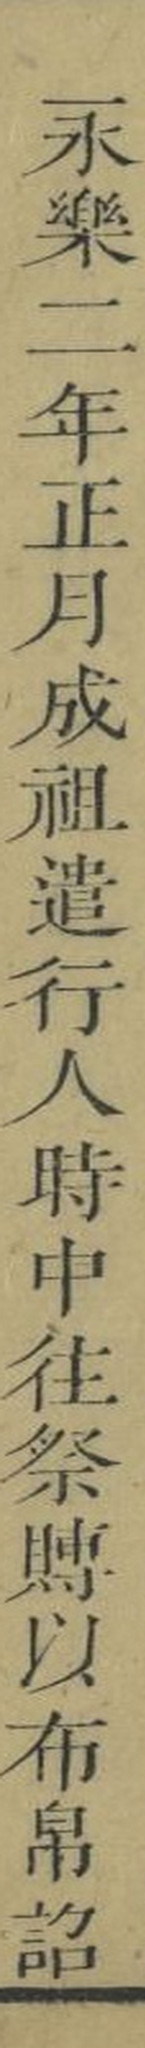永楽二年正月成祖遣行人時中往祭賻以布帛詔
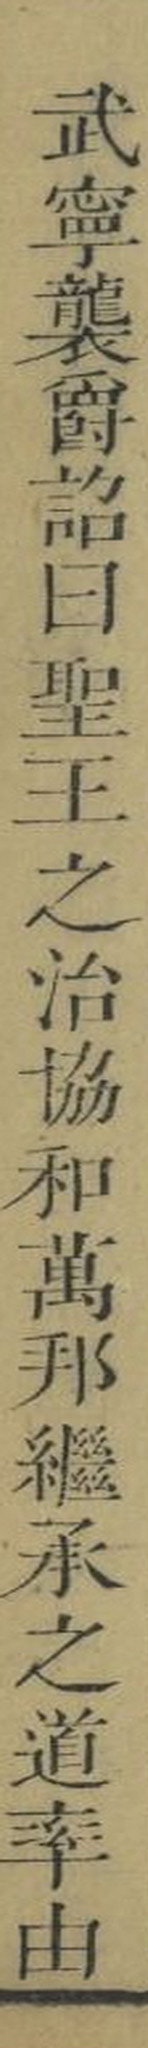武寧襲爵詔曰聖王之治協和万邦継承之道率由
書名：中山伝信録 巻三
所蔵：University of the Ryukyus Library
